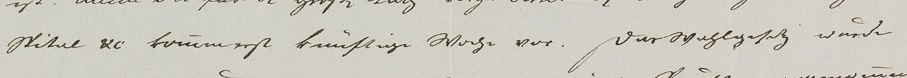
Spital &c. kommen erst künftige Woche vor. Das Wahlgesetz wurde
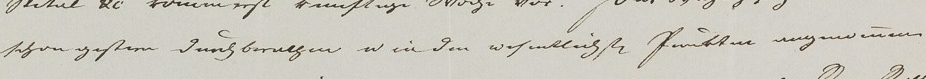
schon gestern durchberathen u in den wesentlichsten Punkten angenommen.
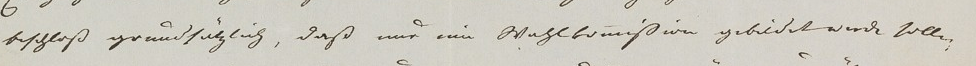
beschloß grundsätzlich, daß nur eine Wahlkommission gebildet werden solle;
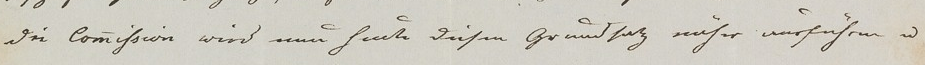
die Commission wird nun heute diesen Grundsatz näher ausführen u
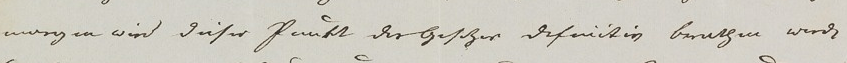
morgen wird dieser Punkt des Gesetzes definitiv berathen werden.
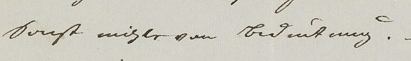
Sonst nichts von Bedeutung. –
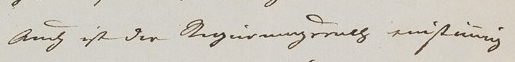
Auch ist der Regierungsrath einstimmig
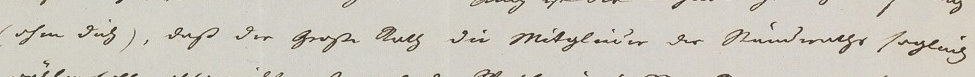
(ohne dich), daß der Große Rath die Mitglieder des Ständeraths sogleich
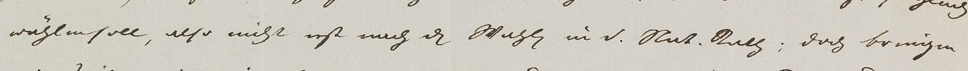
wählen soll, also nicht erst nach den Wahlen in d.Nat.Rath; doch bringen
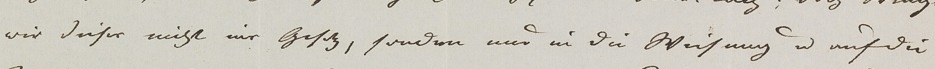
wir dieses nicht ins Gesetz, sondern nur in die Weisung u auf die
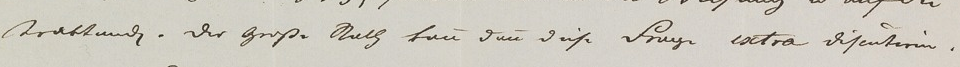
Traktanden. Der Große Rath kann dann diese Frage extra discutiren.
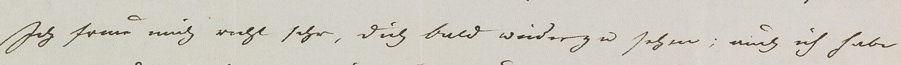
Ich freue mich recht sehr, dich bald wieder zu sehen; auch ich habe
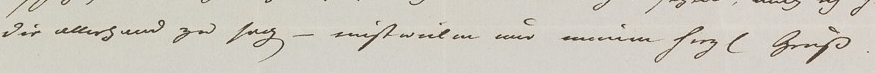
dir allerhand zu sagen – einstweilen nur meinen herzl. Gruß.
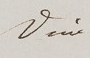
dein
